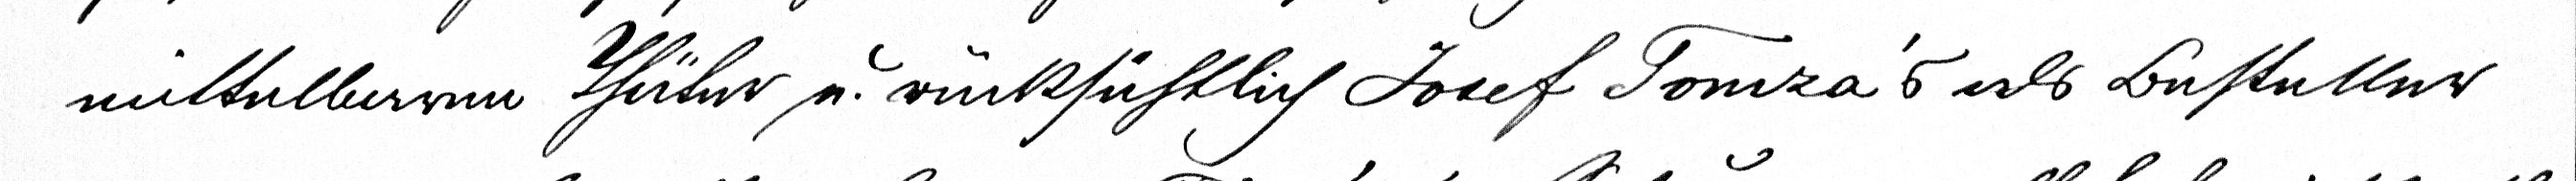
mittelbaren Thäter u. rücksichtlich Josef Tomza’s als Besteller
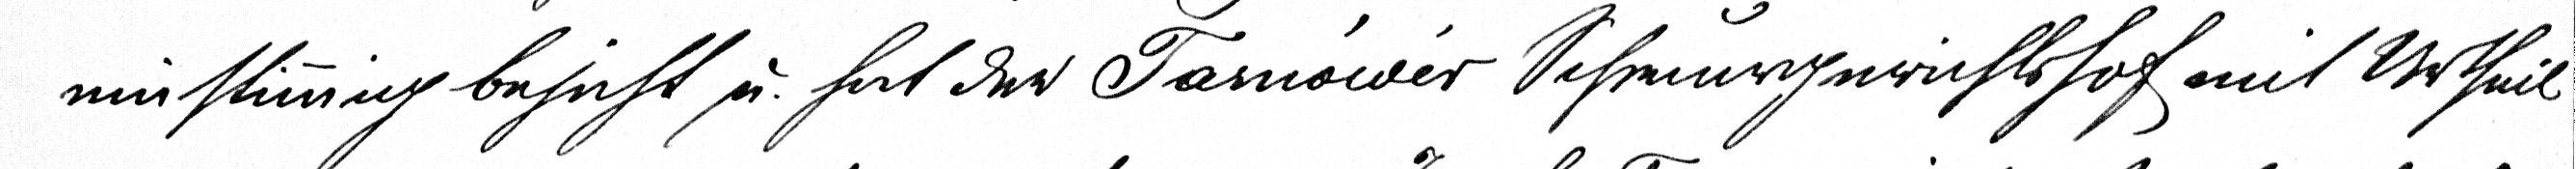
einstimmig bejaht u. hat der Tamówér Schwurgerichtshof mit Urtheil
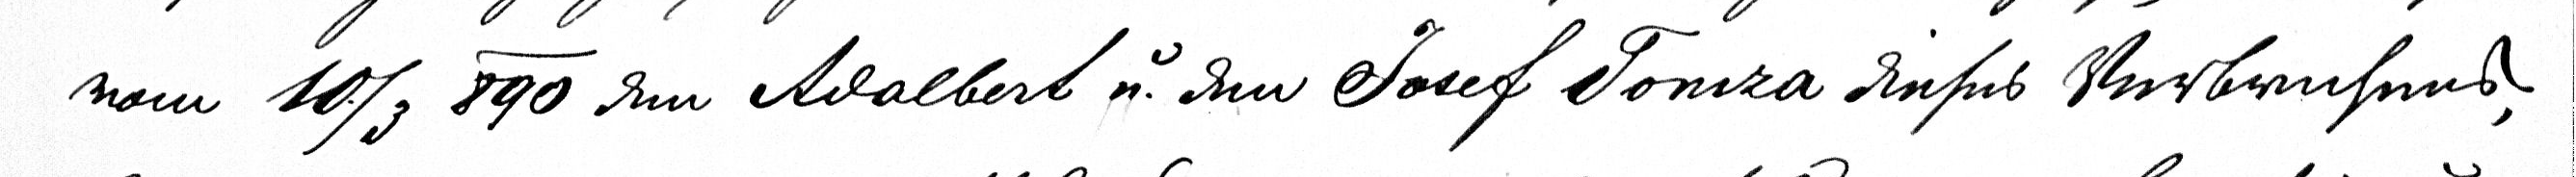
vom 10/3 890 dem Adalbert u. den Josef Tomza dieses Verbrechens,
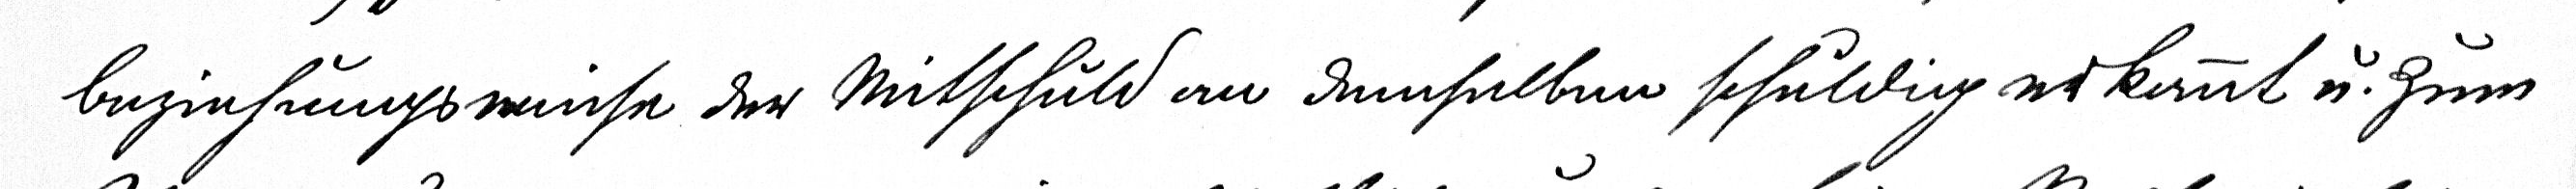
beziehungsweise der Mitschuld an demselben schuldig erkannt u. zum
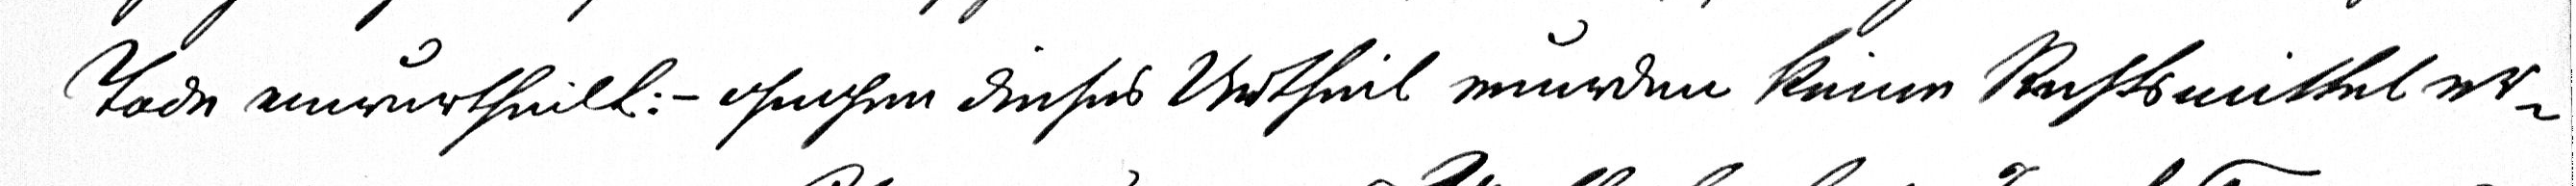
Tode verurtheilt:- Gegen dieses Urtheil wurden keine Rechtsmittel er
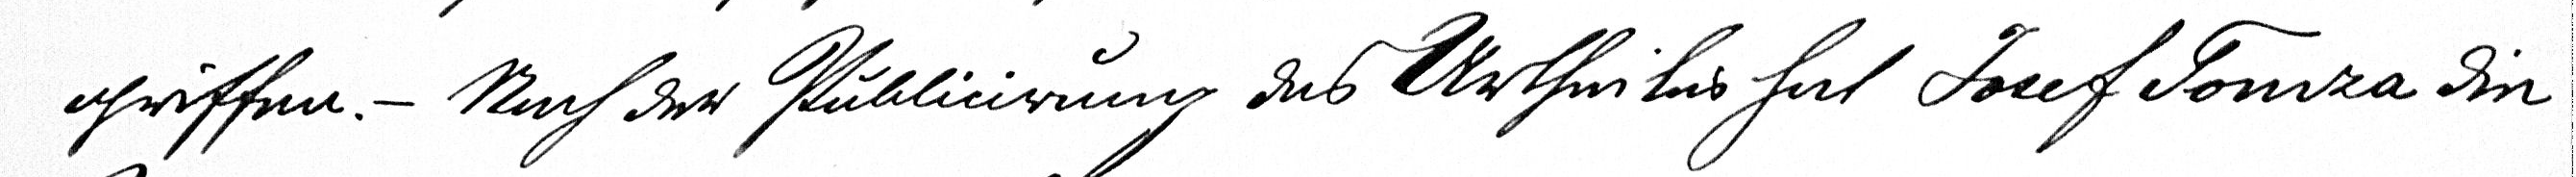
griffen.- Nach der Publicirung des Urtheiles hat Josef Tomza die
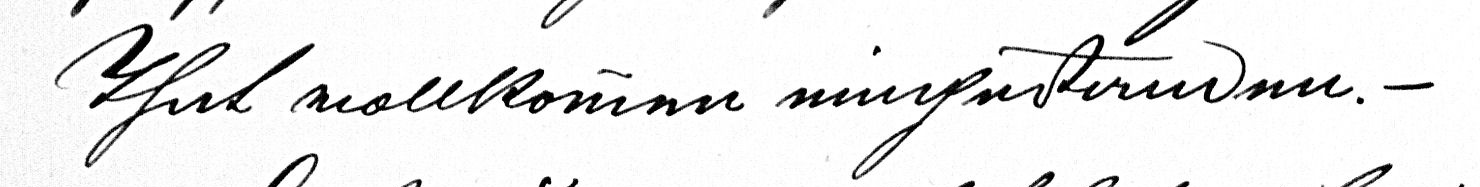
That vollkommen eingestanden.-
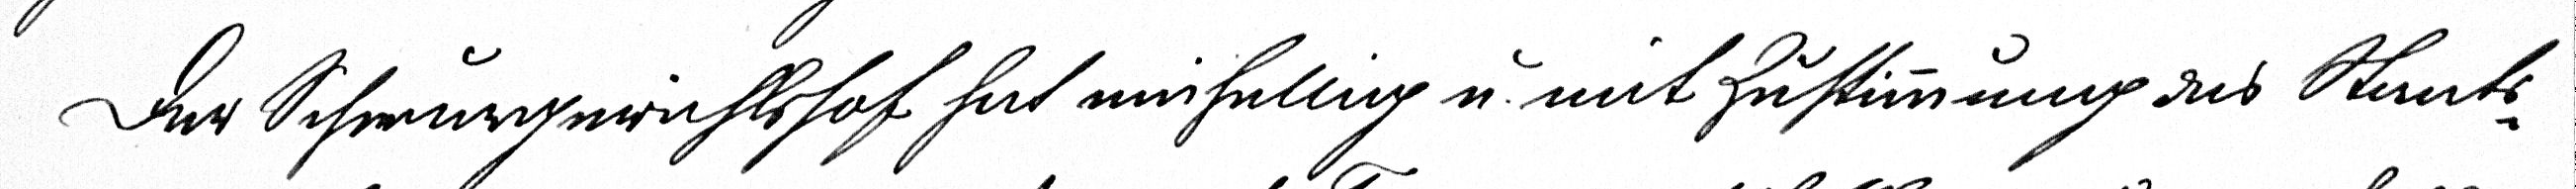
Der Schwurgerichtshof hat einhellig u. mit Zustimmung das Staats¬
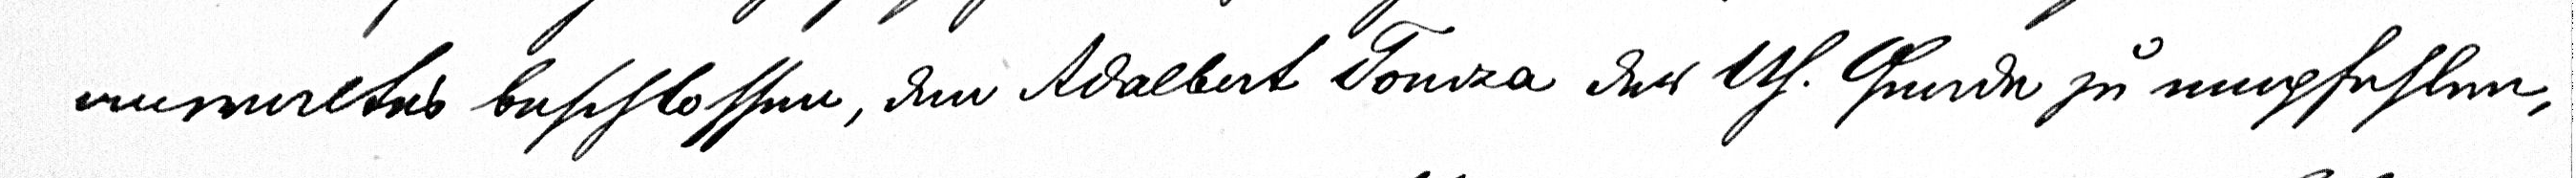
anwaltes beschlossen, den Adalbert Tomza der Ah. Gnade zu empfehlen,
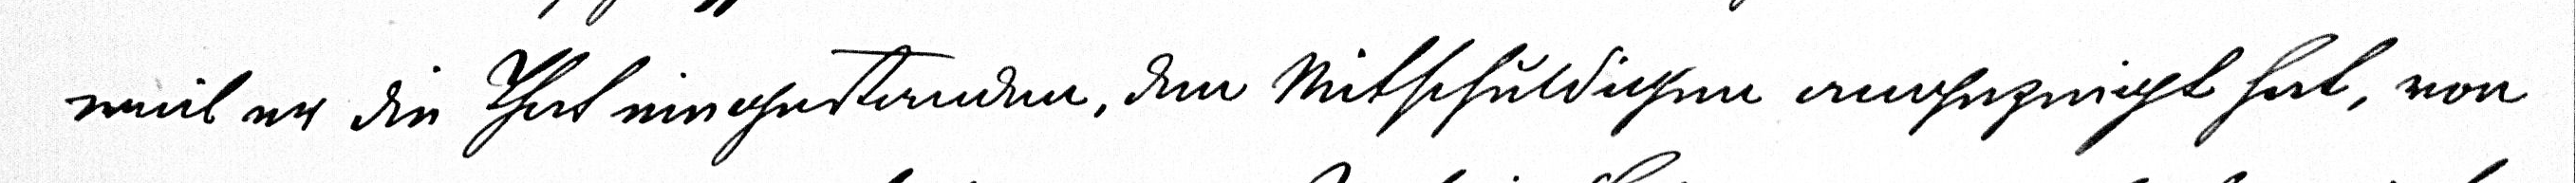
weil er die That eingestanden, den Mitschuldigen angezeigt hat, von
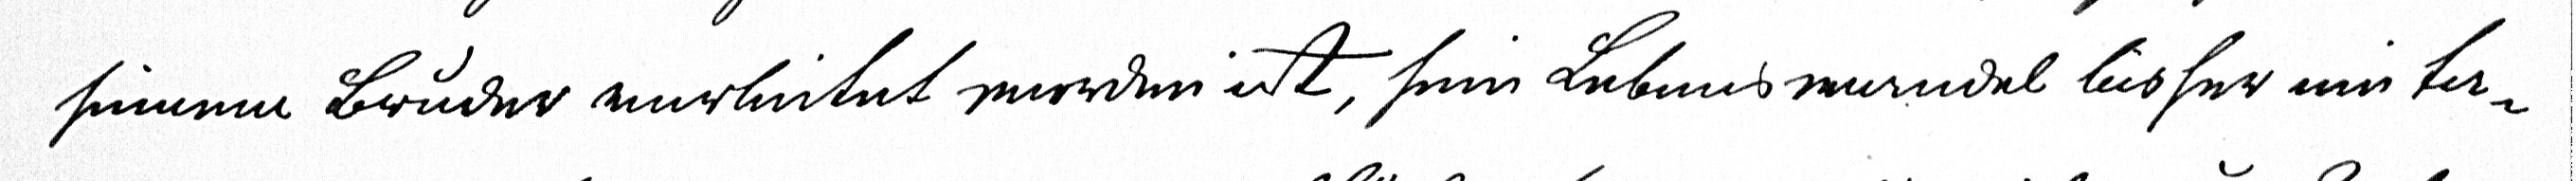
seinem Bruder verleitet worden ist, sein Lebenswandel bisher ein ta¬
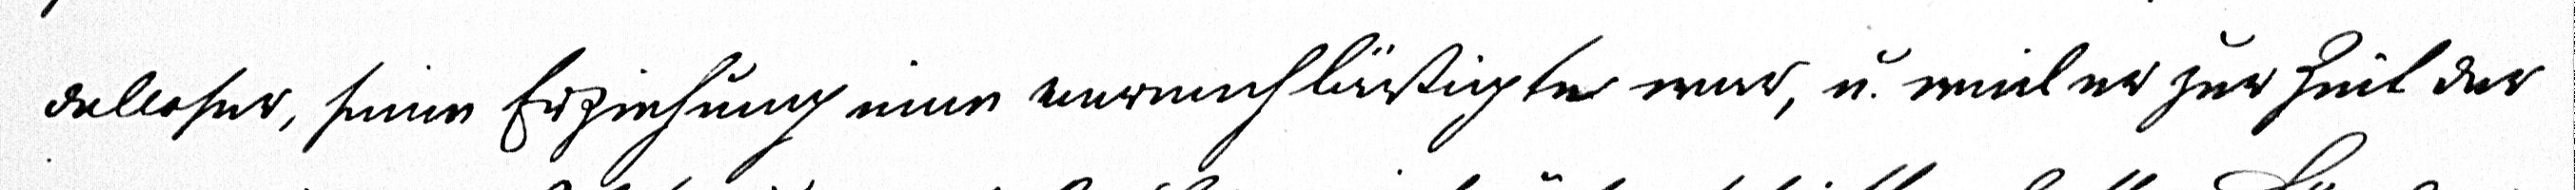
delloser, seine Erziehung eine vernachläßigte war, u. weil er zur Zeit der
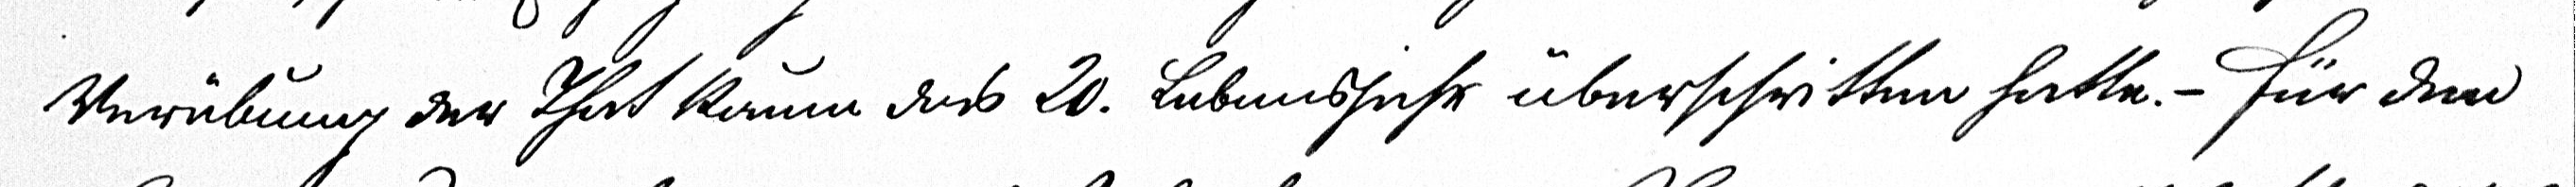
Verübung der That kaum das 20. Lebenssehr überschritten hatte.- Für den
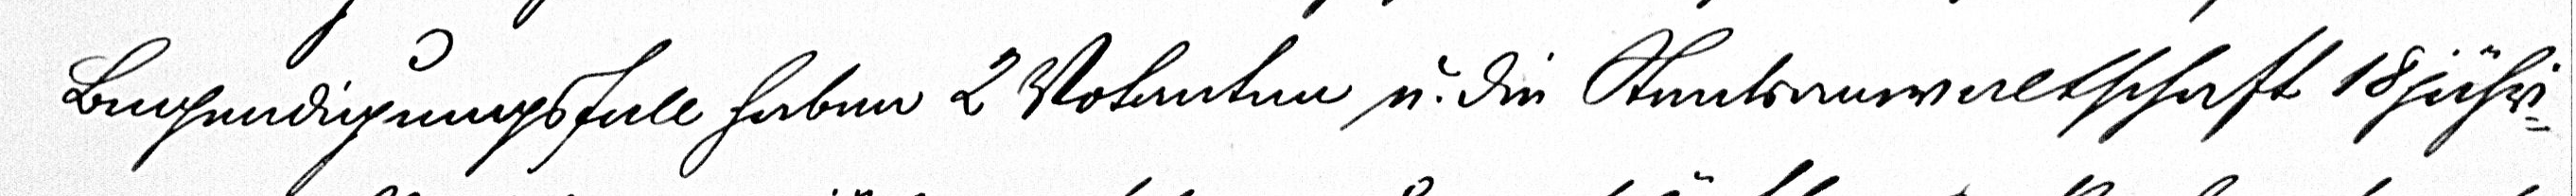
Begnadigungsfall haben 2 Votanten u. die Staatsanwaltschaft 18jähri¬
